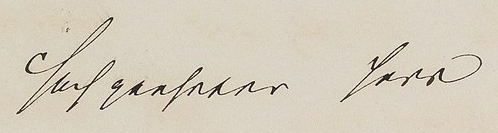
Hochgeehrter Herr
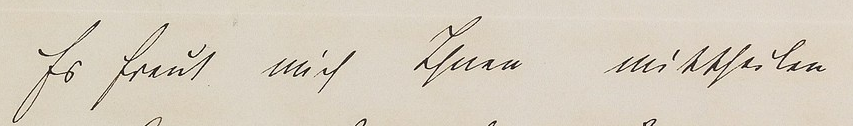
Es freut mich Ihnen mittheilen
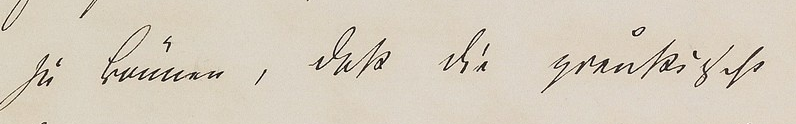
zu können, daß die preußische
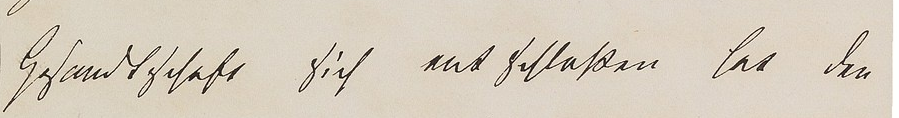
Gesandtschaft sich entschloßen hat den
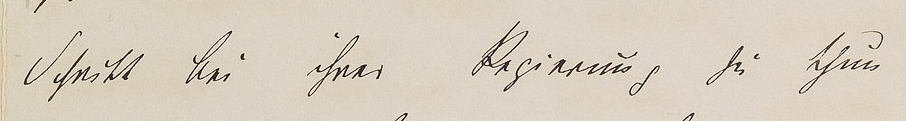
Schritt bei ihrer Regierung zu thun
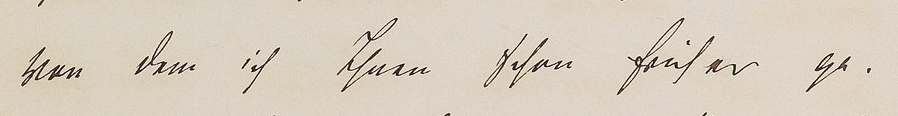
von dem ich Ihnen schon früher ge-
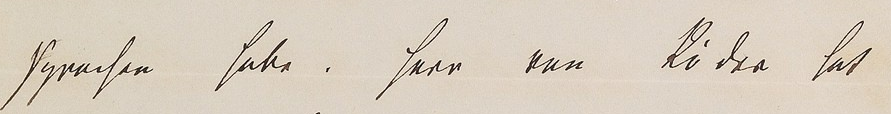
sprochen habe. Herr von Röder hat
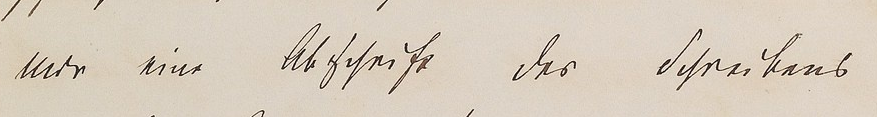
mir eine Abschrift des Schreibens
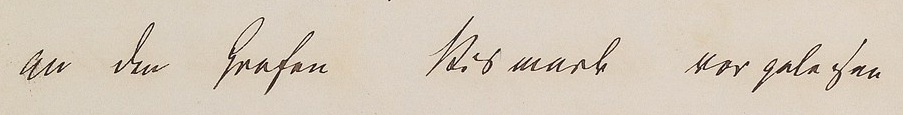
an den Grafen Bismark vorgelesen
